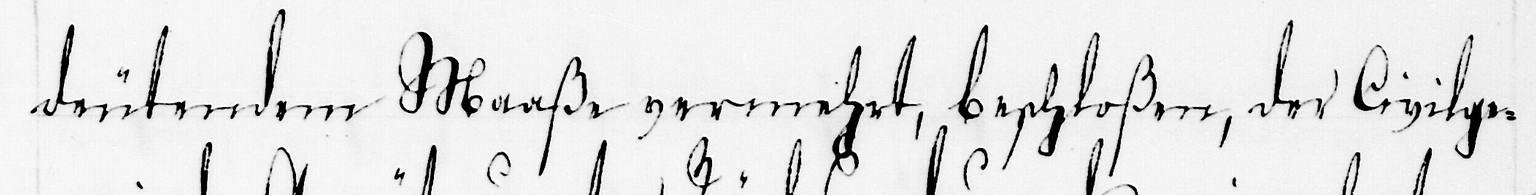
deutendem Maaße vermehrt, beschloßen, der Civilge¬
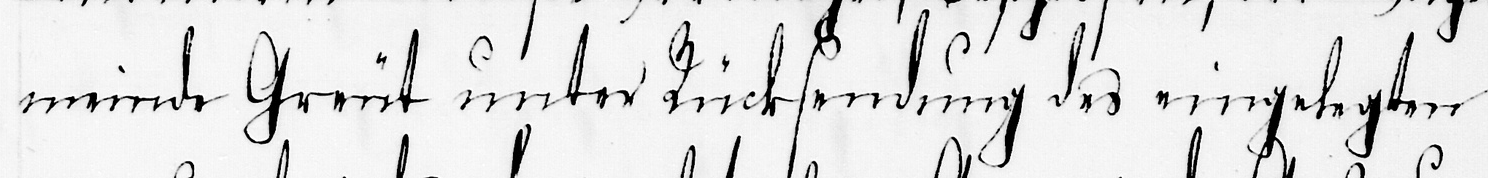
meinde Greut unter Rücksendung des eingelegten
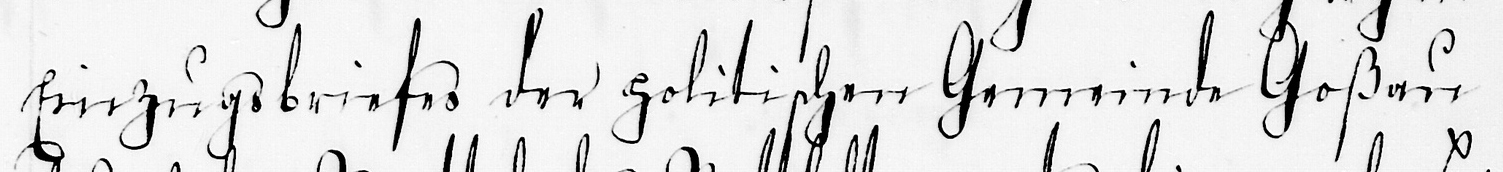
Einzugsbriefes der politischen Gemeinde Goßau
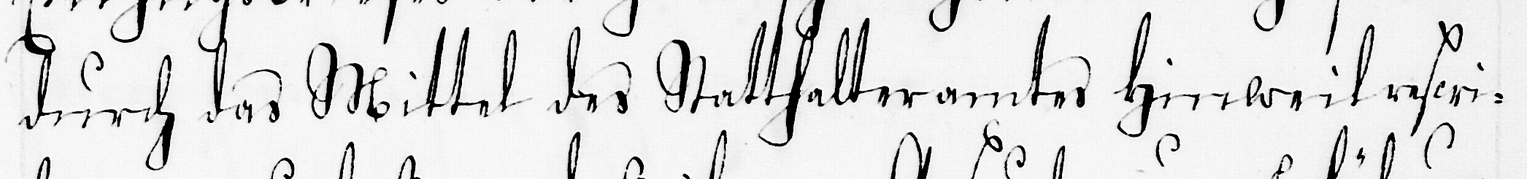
durch das Mittel des Statthalteramtes Hinweil rescri¬
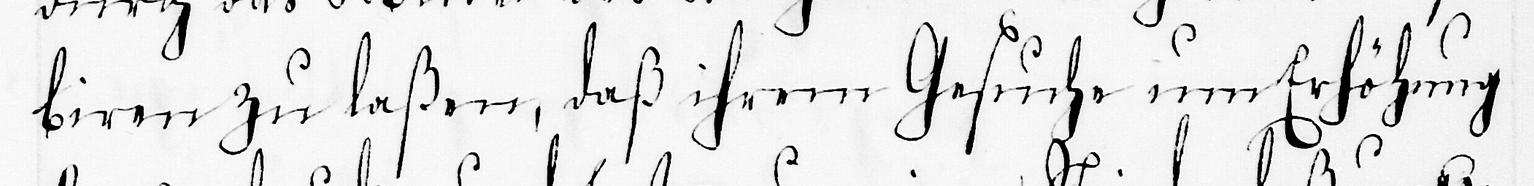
biren zu laßen, daß ihrem Gesuche um Erhöhung
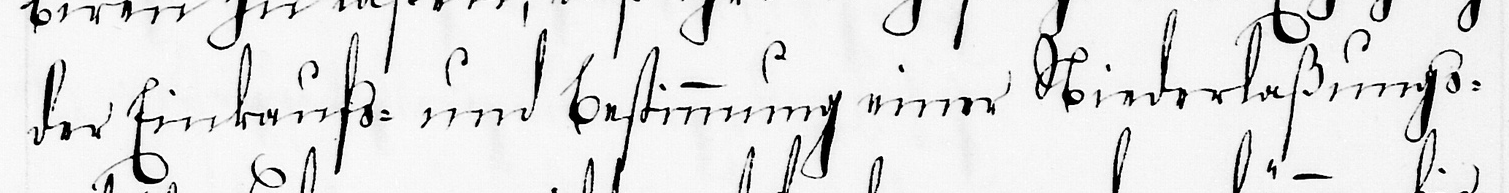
der Einkaufs- und Bestimmung einer Niederlaßungs¬
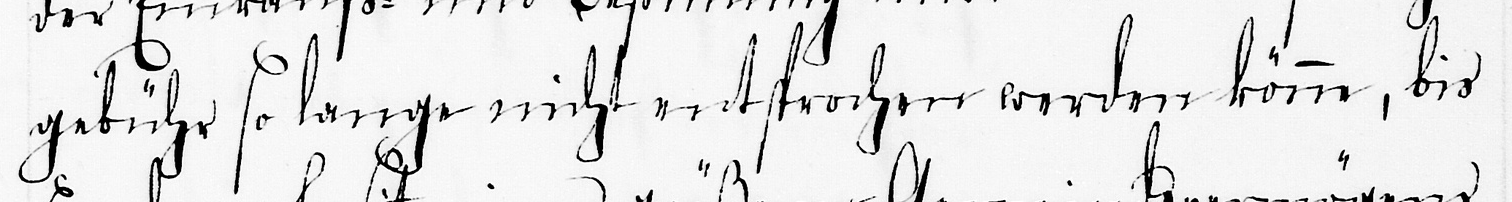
gebühr so lange nicht entsprochen werden könne, bis
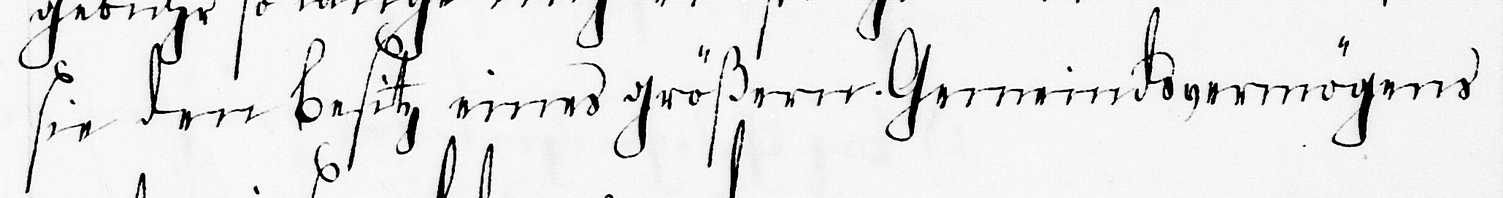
sie den Besitz eines größern Gemeindsvermögens
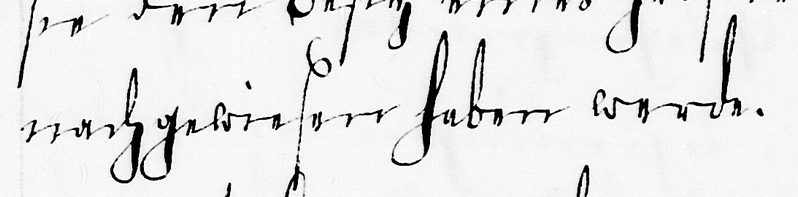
nachgewiesen haben werde.
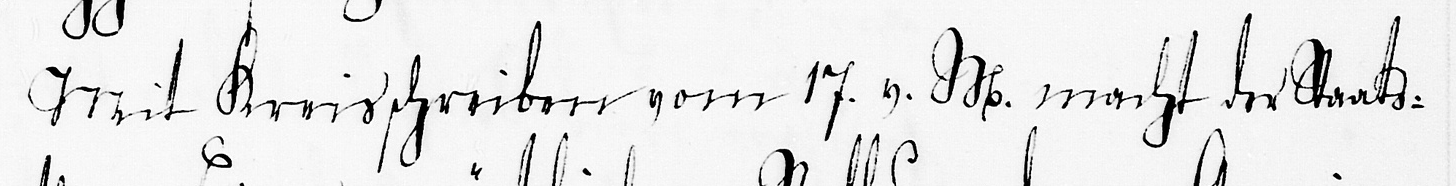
Mit Kreisschreiben vom 17. v. M. macht der Staats¬
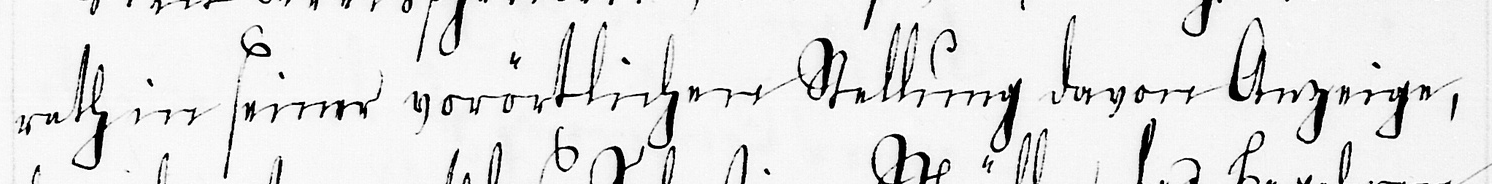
rath in seiner vorörtlichen Stellung davon Anzeige,
